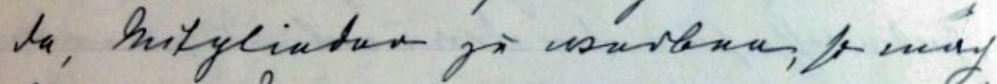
de Mitglieder zu werben, so mach
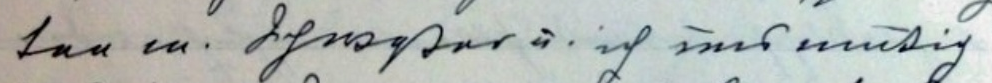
ten m. Schwester u. ich uns mutig
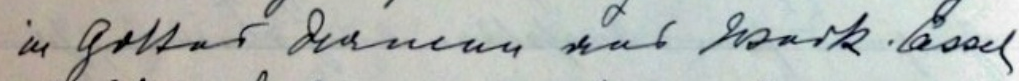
in Gottes Namen ans Werk. Cassel
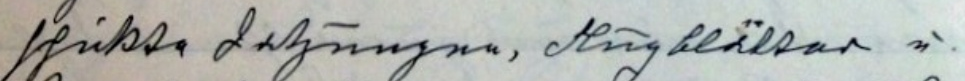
Cassel schickte Satzungen, Flugblätter u.
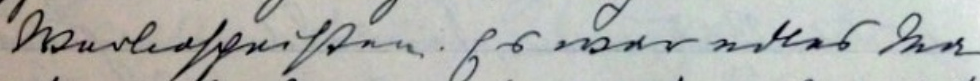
Werbeschriften. Es war edles Ma
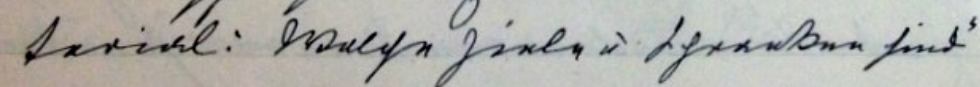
terial: Welche Ziele und Schranken sind
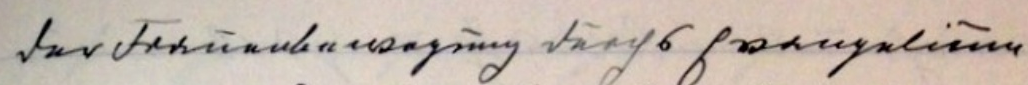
der Frauenbewegung durch d. Evangelium
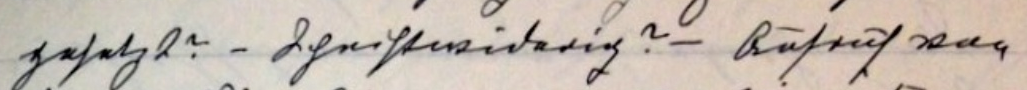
gesetzt? - Schriftwiderig ?- Aufwuf von
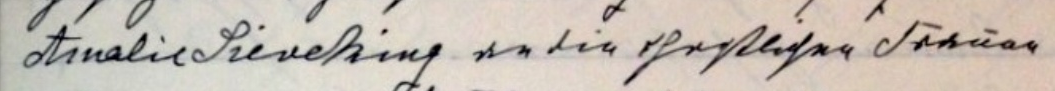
Amalie Sieveking an die christlichen Frauen
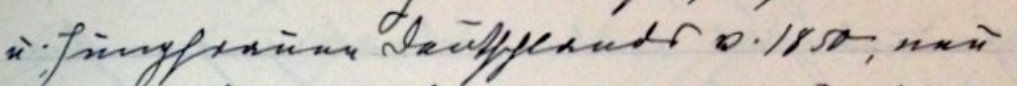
u. Jungfrauen Deutschlands v. 1850, neu
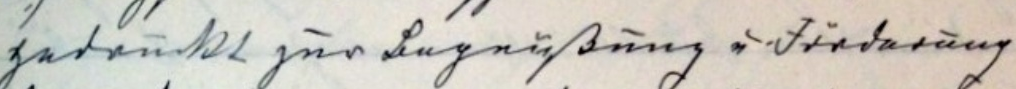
gedruckt zur Begrüßung u. Förderung
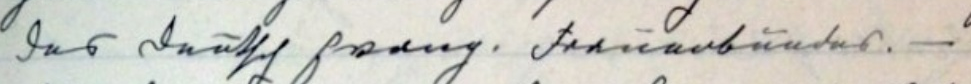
des deutsch Evang. Frauenbundes -
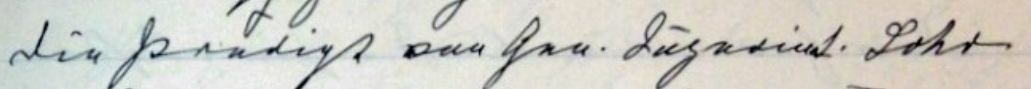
Die Predigt von Gen. Superint. Lohr
